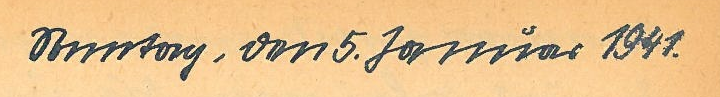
Sonntag, den 5. Januar 1941.
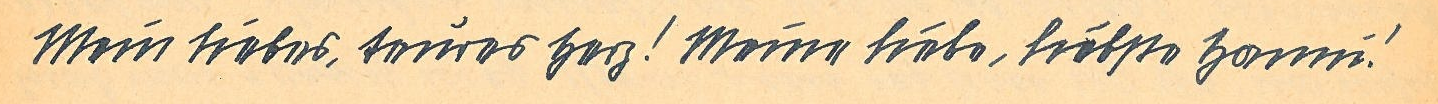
Mein liebes, teures Herz! Meine liebe, liebste!
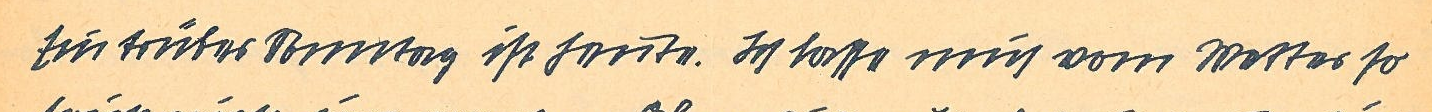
Ein trüber Sonntag ist heute. Ich lasse mich vom Wetter so
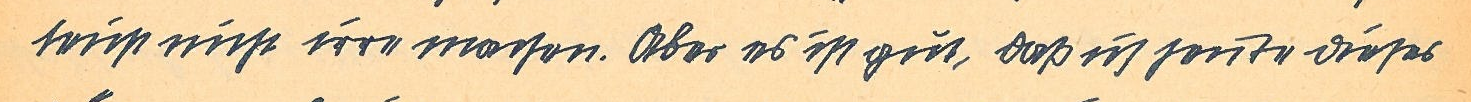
leicht nicht irre machen. Aber es ist gut, daß ich heute dieses
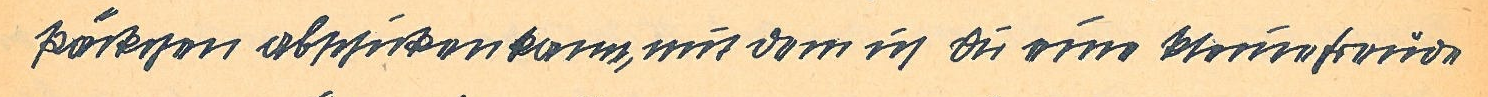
Päckchen abschicken kann, mit dem ich Dir eine kleine Freude
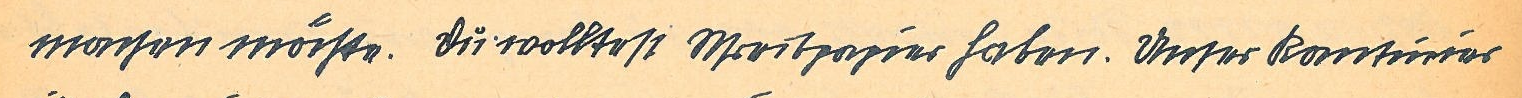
machen möchte. Du wolltest Schreibpapier haben. Unser Kantinier
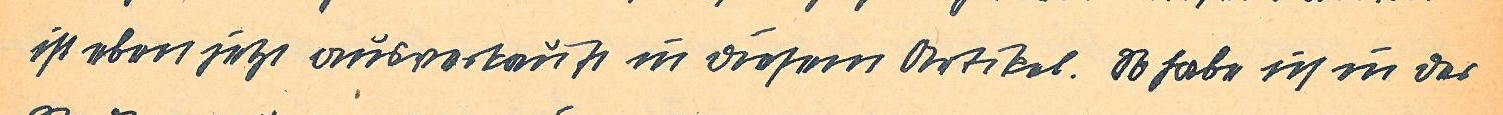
ist eben jetzt ausverkauft in diesem Artikel. So habe ich in der
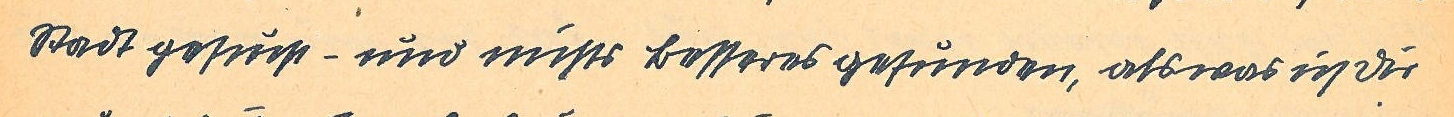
Stadt gesucht – und nichts besseres gefunden, als was ich Dir
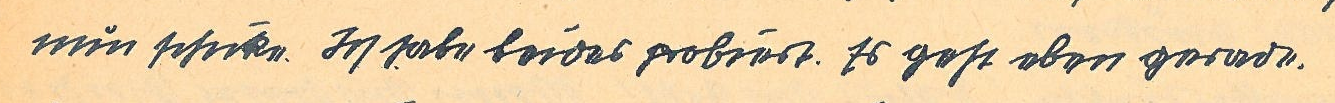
nun schicke. Ich habe beides probiert. Es geht eben gerade.
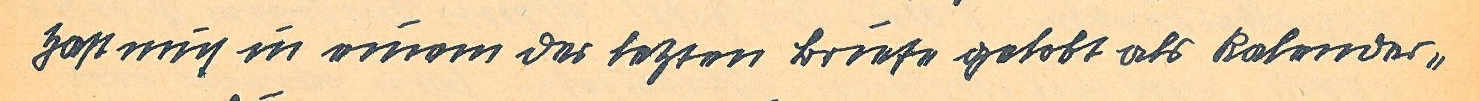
Hast mich in einem der letzten Briefe gelobt als Kalender¬
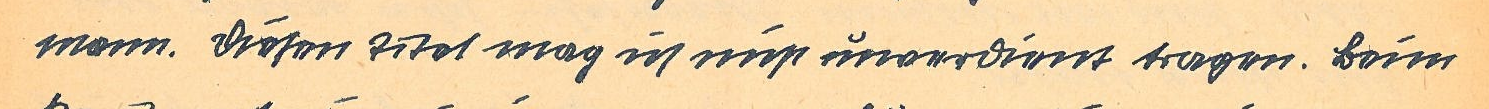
mann. Diesen Titel mag ich nicht unverdient tragen. Beim
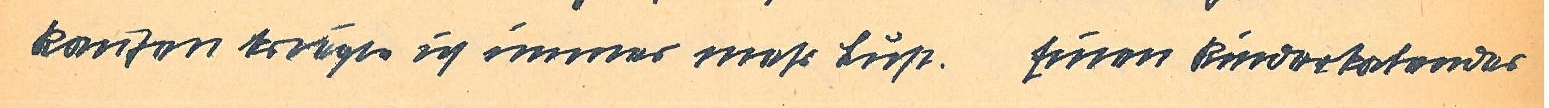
Kaufen kriegte ich immer mehr Lust. Einen Kinderkalender
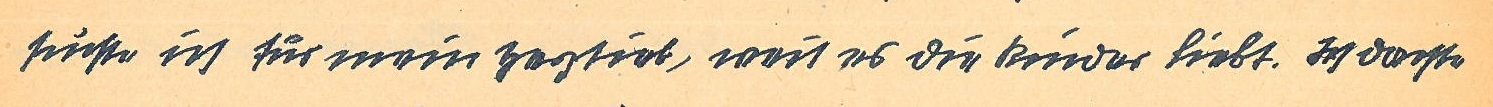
sucht ich für mein Herzlieb, weil es die Kinder liebt. Ich dachte
